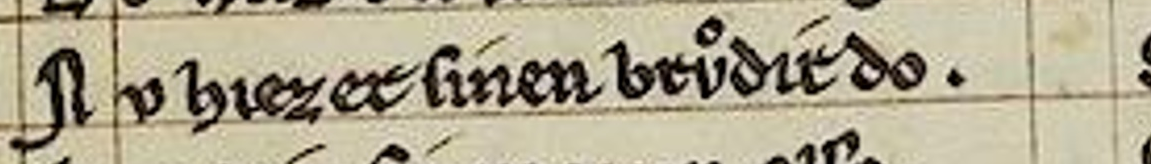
Nv hiez er ſinen brv°odir do.
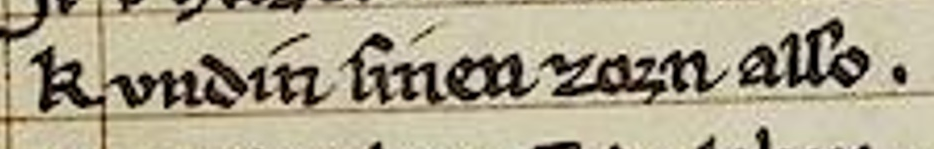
Kvndin ſinen zorn alſo.
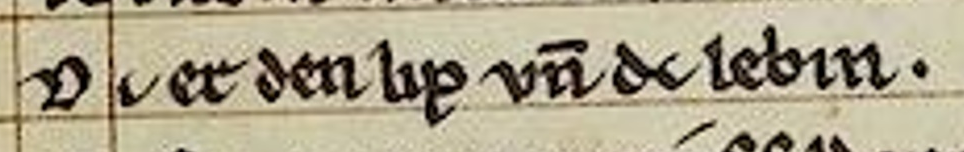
D(az) er den lip vn(d) d(az) lebin.
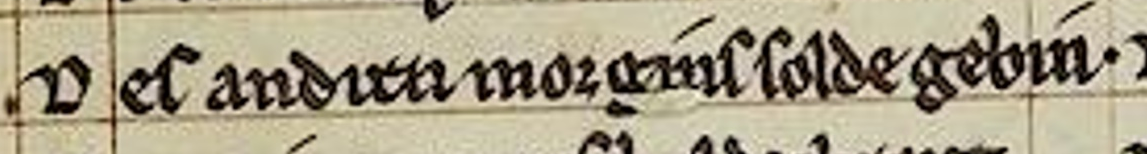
Deſ andirn morginſ ſolde gebin.
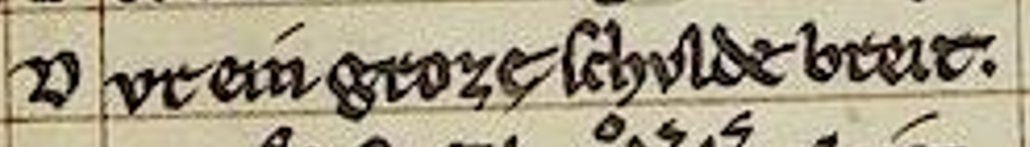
Dvr ein groze ſchvlde breit.
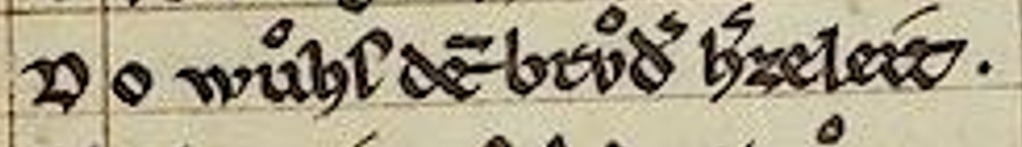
Do wu°ohſ de(m) brv°od(er) h(er)zeleit.
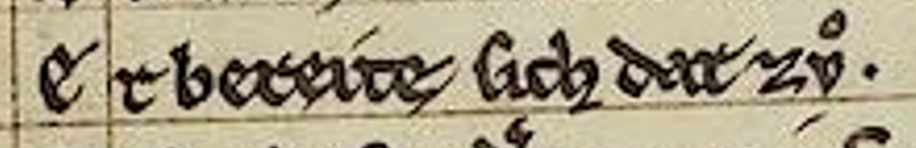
Er bereite ſich dar zv°o.
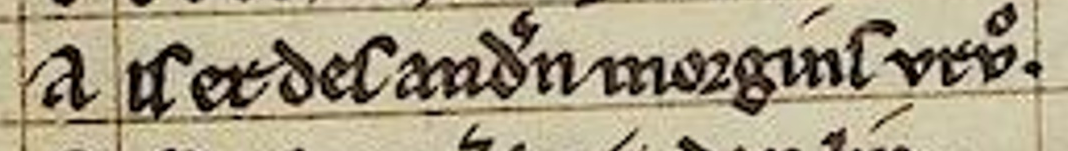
Alſ er deſ and(er)n morginſ vrv°o.
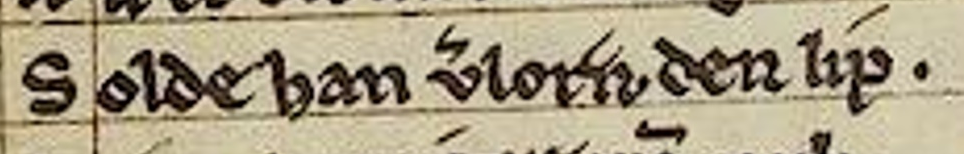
Solde han v(er)lorn den lip.
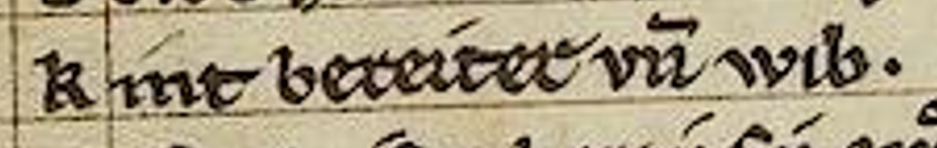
Kint bereiter vn(d) wib.
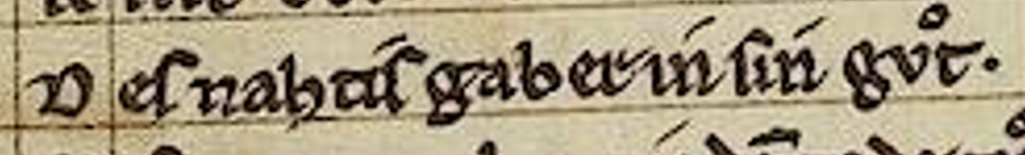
Deſ nahtiſ gab er in ſin gv°ot.
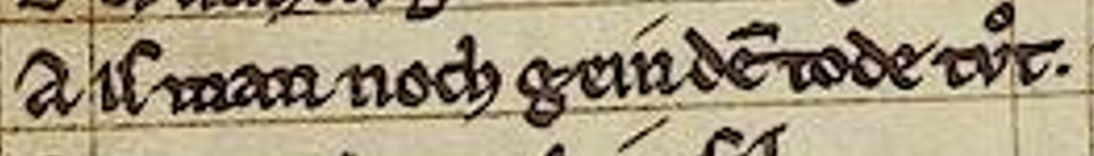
Alſ man noch gein de(m) tode tv°ot.
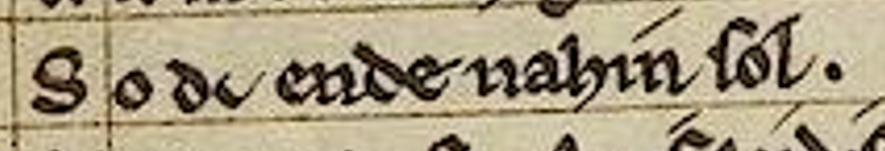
So d(az) ende nahin ſol.
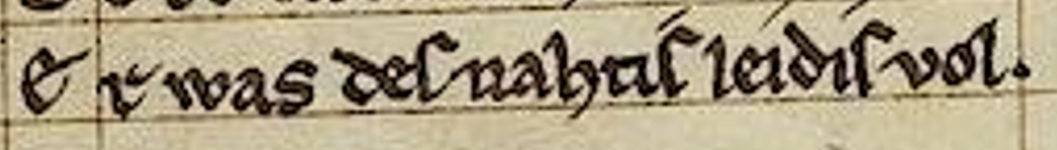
Er was deſ nahtiſ leidiſ vol.
